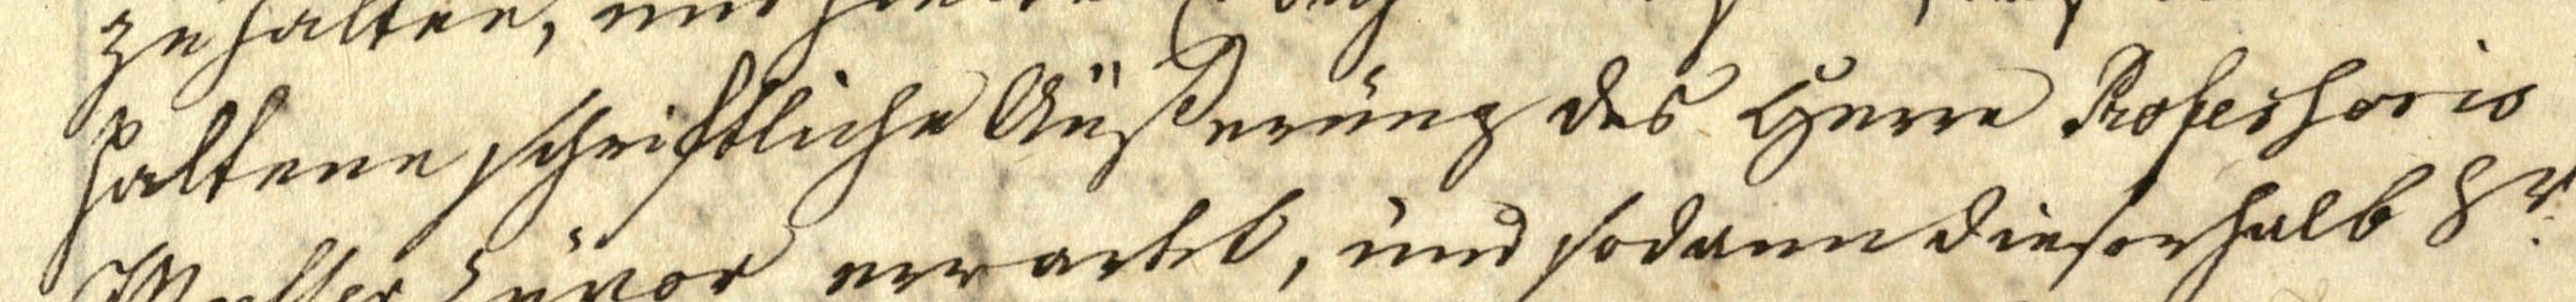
haltene schriftliche Äußerung des Herrn Professoris
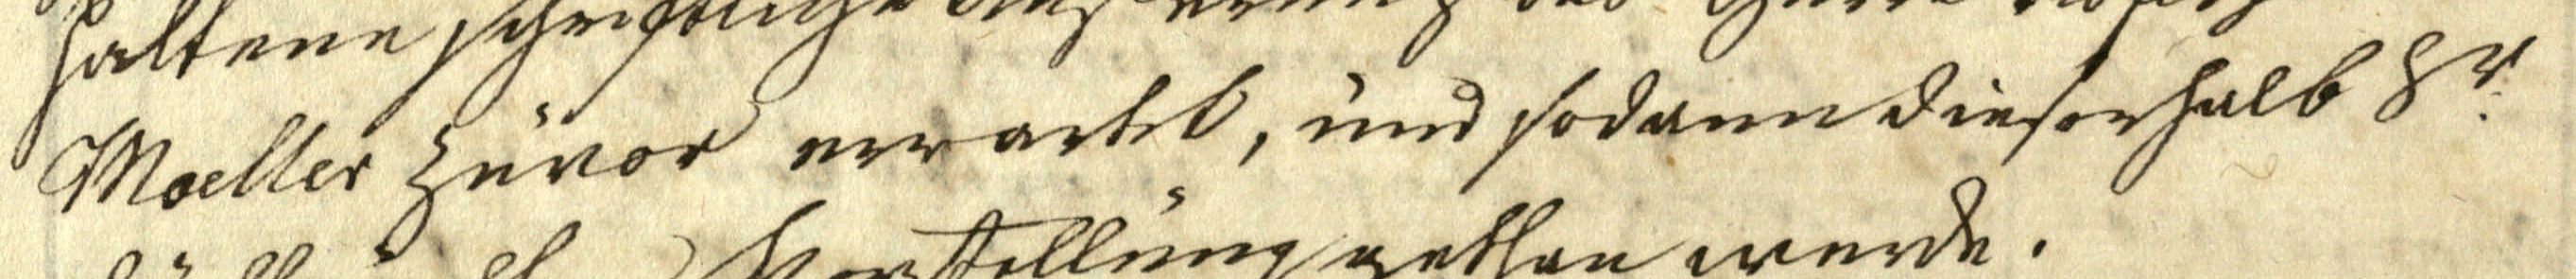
Moeller zuvor erwartet, und sodann dieserhalb Sr
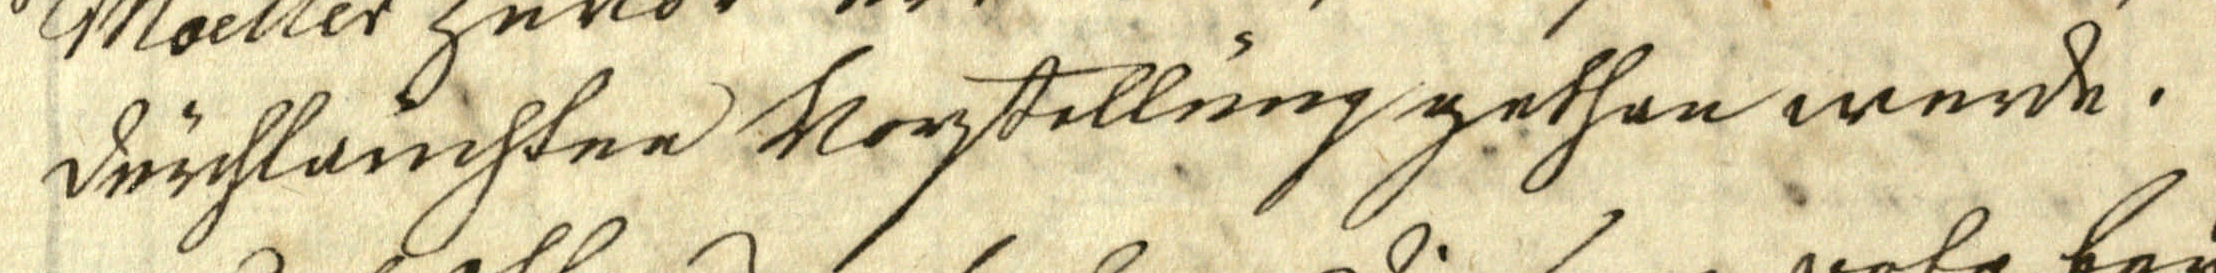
Durchlauchten Vorstellung gethan werde.
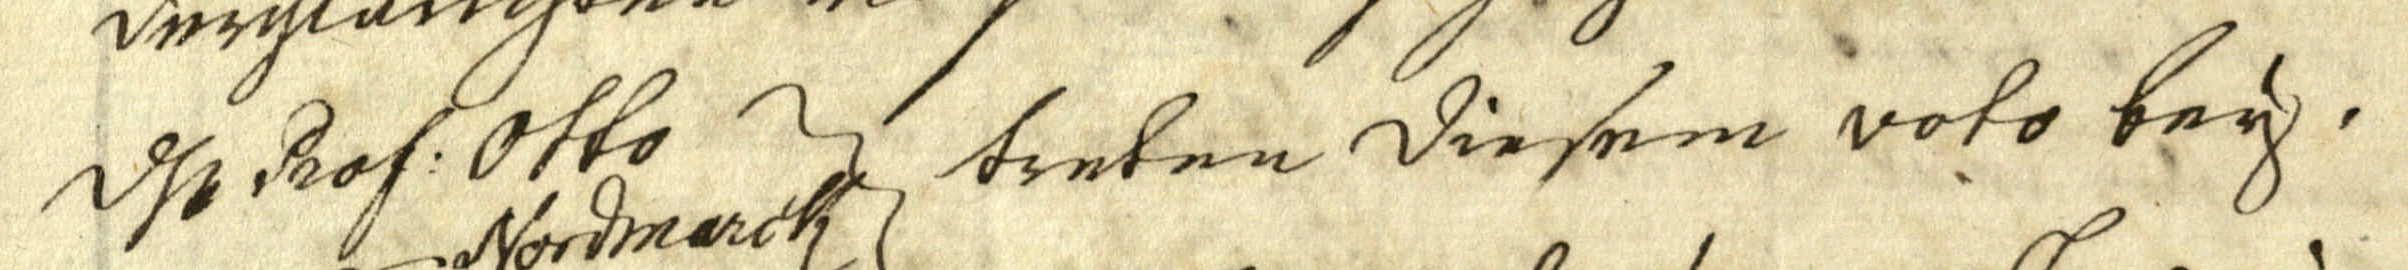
dh. Prof. Otto treten diesem voto beÿ.
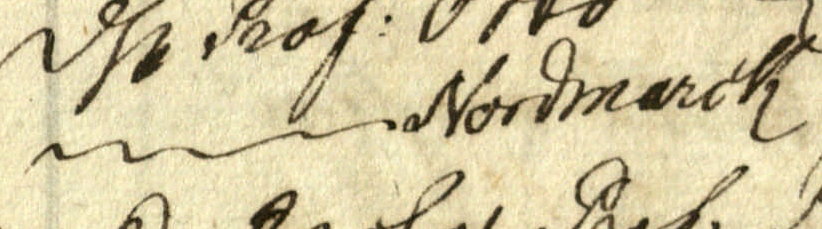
Nordmarck
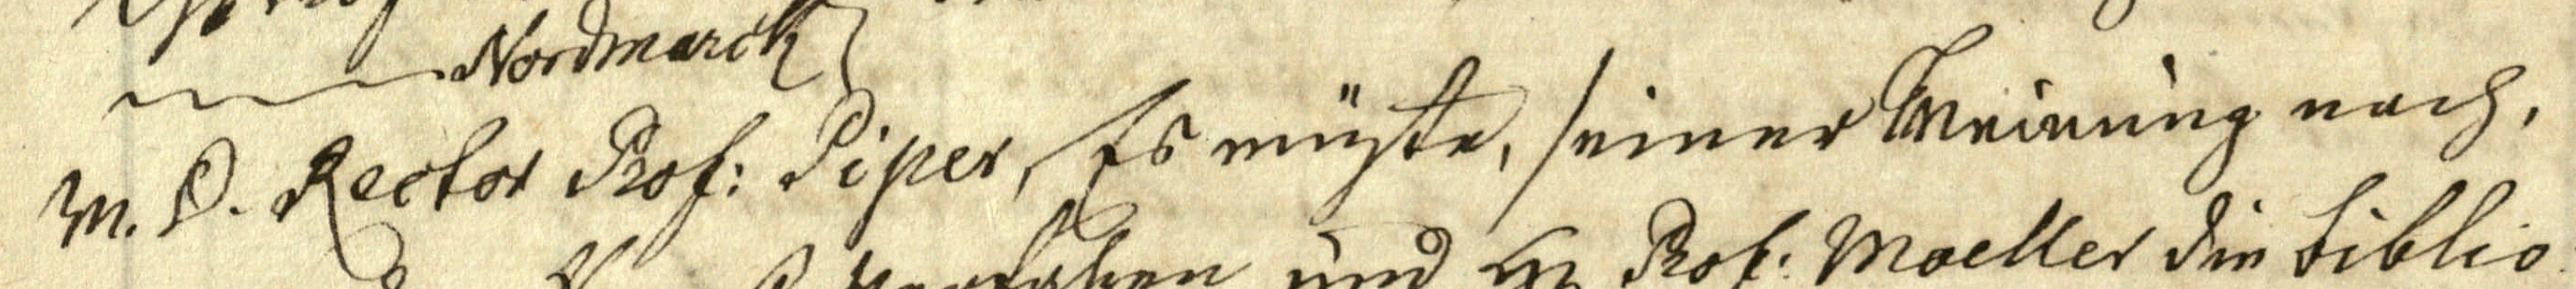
M. D. Rector Prof. Piper, Es müßte, seiner Meinung nach,
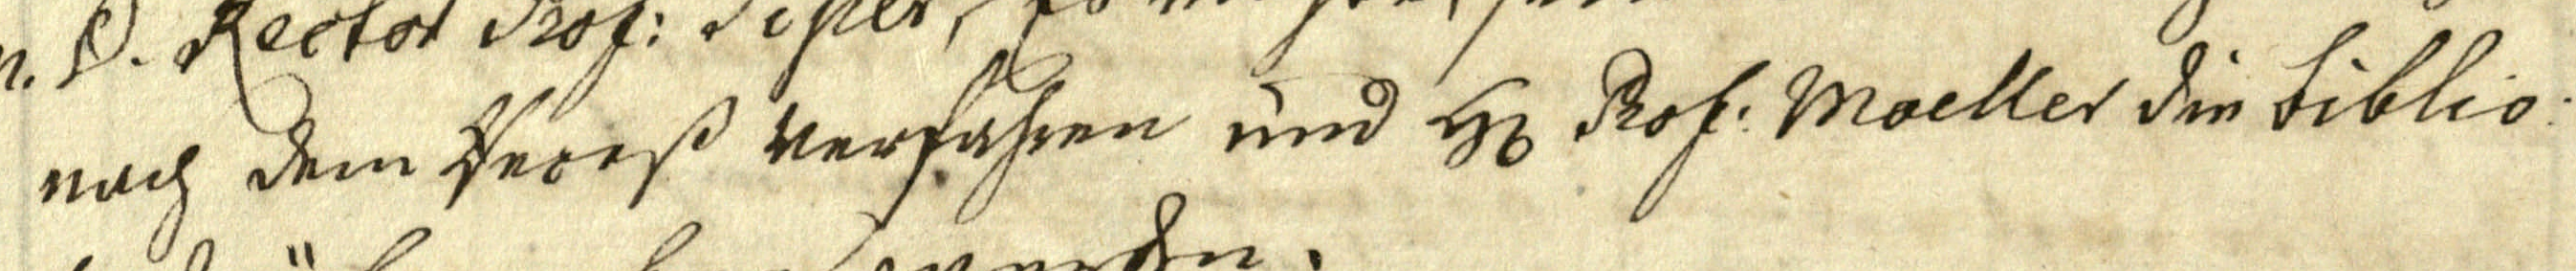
nach dem Receß verfahren und H. Prof. Moeller die Biblio¬
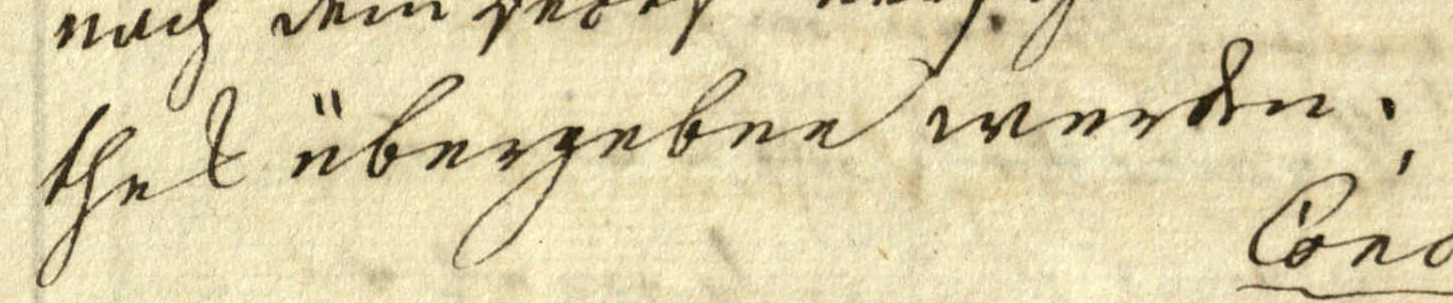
thek übergeben werden.
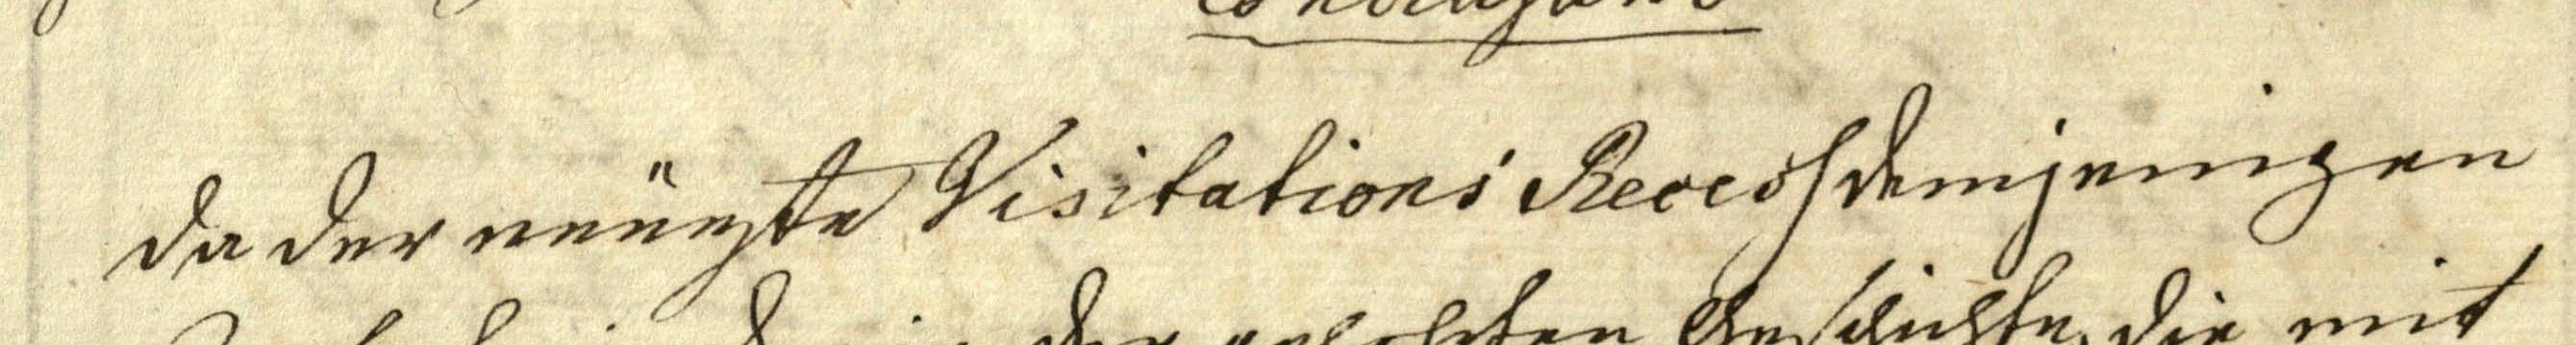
Da der neueste Visitations Recess demjenigen
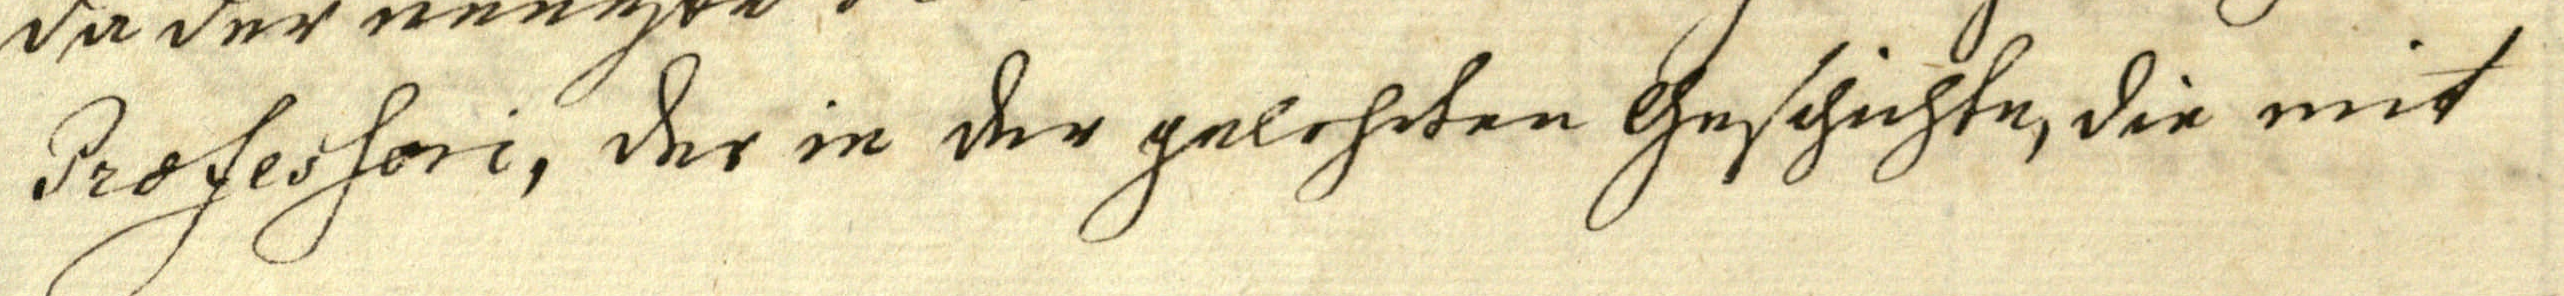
Professori, der in der gelehrten Geschichte, die mit
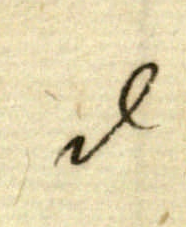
d
